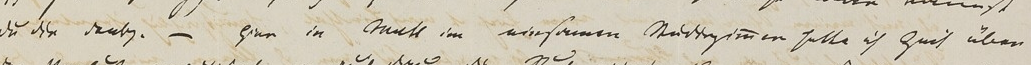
du dir denken. – Hier in Matt im einsamen Studirzimmer hatte ich Zeit über
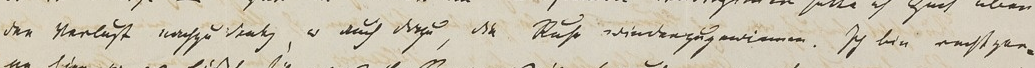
den Verlust nachzudenken, u auch dazu, die Ruhe wiederzugewinnen. Ich bin recht ger-
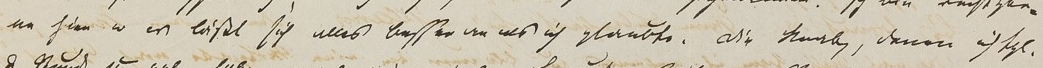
ne hier u es läßt sich alles besser an als ich glaubte. Die Knaben, denen ich tgl.
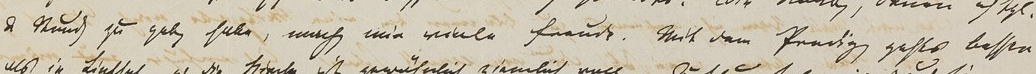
2 Stunden zu geben habe, machen mir viele Freude. Mit dem Predigen gehts besser
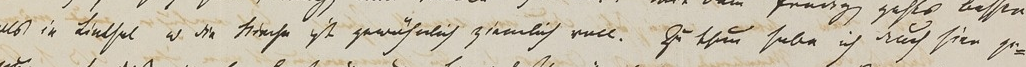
als in Linthal & die Kirche ist gewöhnlich ziemlich voll. Zu thun habe ich auch hier ge-
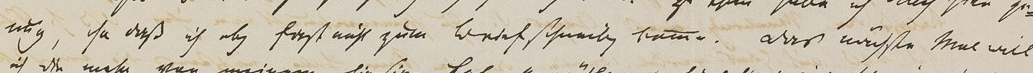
nug, so daß ich eben fast nicht zum Briefschreiben komme. Das nächste Mal will
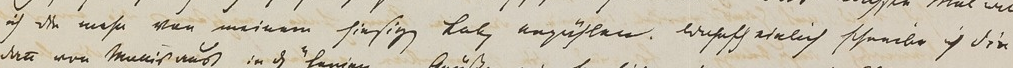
ich dir mehr von meinem hiesigen Leben erzählen. Wahrscheinlich schreibe ich dir
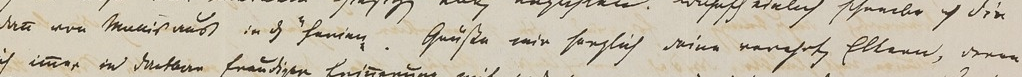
dann von Mollis aus in den «Ferien». – Grüße mir herzlich deine verehrten Eltern, deren
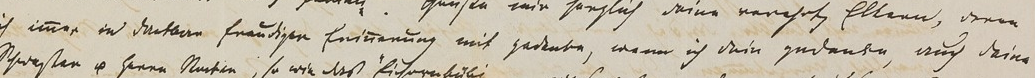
ich immer in dankbar freudiger Erinnerung mit gedenke, wenn ich dein gedenke, auch deine
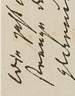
dir
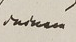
ein getreuer
